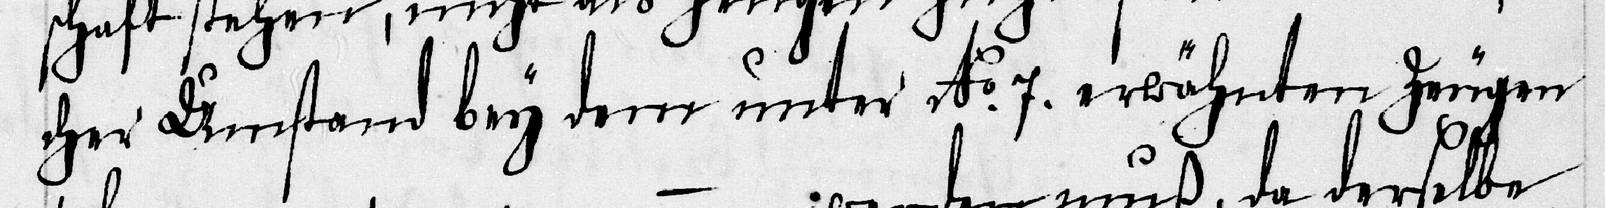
cher Umstand bey dem unter No. 7. erwähnten Zeugen
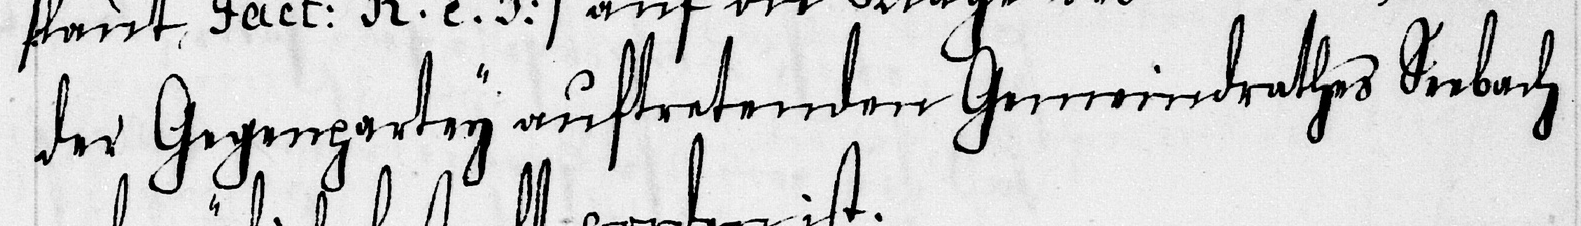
der Gegenpartey auftretenden Gemeindrathes Seebach
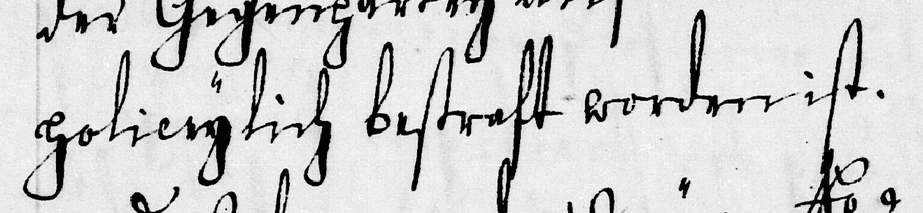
policeylich bestraft worden ist.
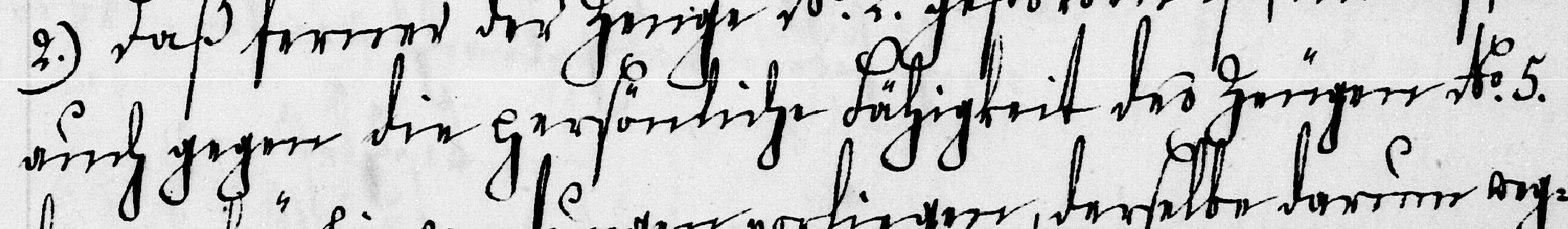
auch gegen die persönliche Fähigkeit des Zeugen No. 5.
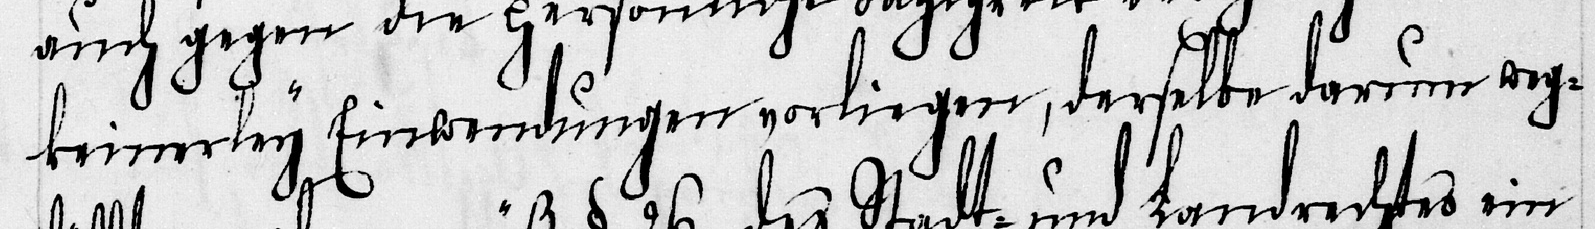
keinerley Einwendungen vorliegen, derselbe darum weg¬
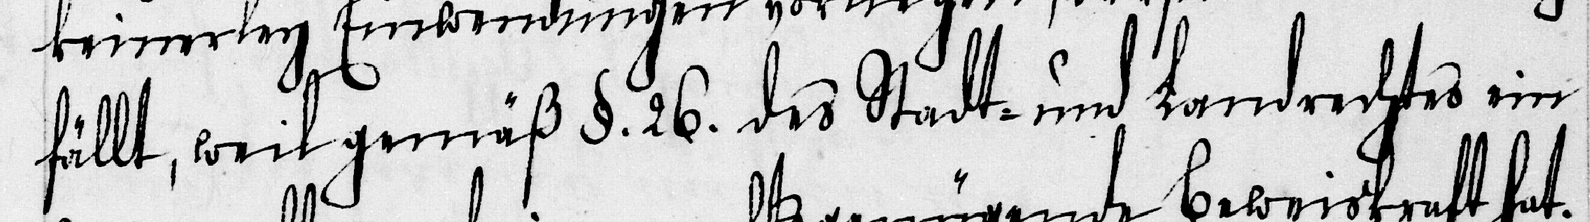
fällt, weil gemäß §.26. des Stadt- und Landrechtes ein
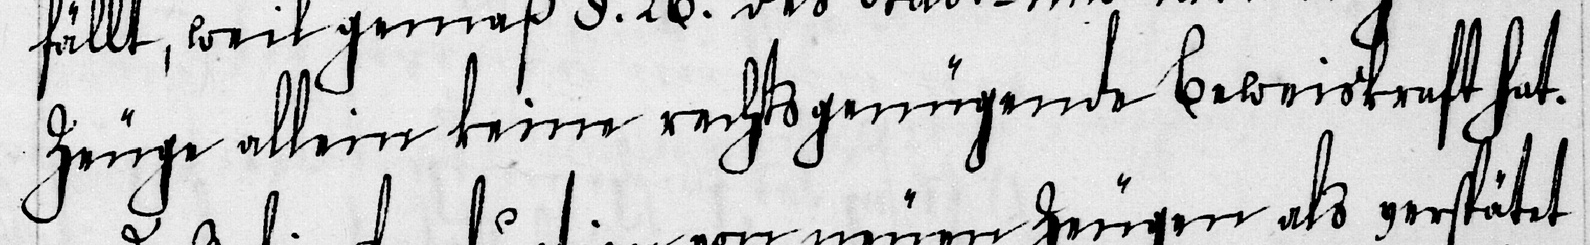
Zeuge allein keine rechtsgenügende Beweiskraft hat.
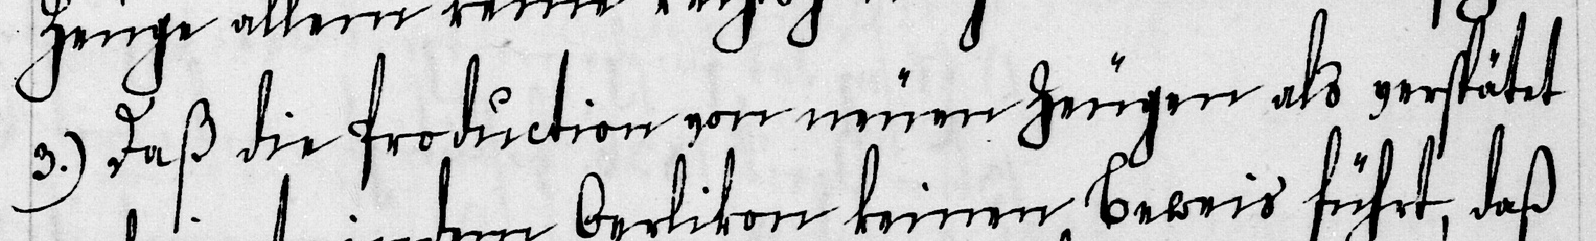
3.) Daß die Production von neuen Zeugen als verspätet
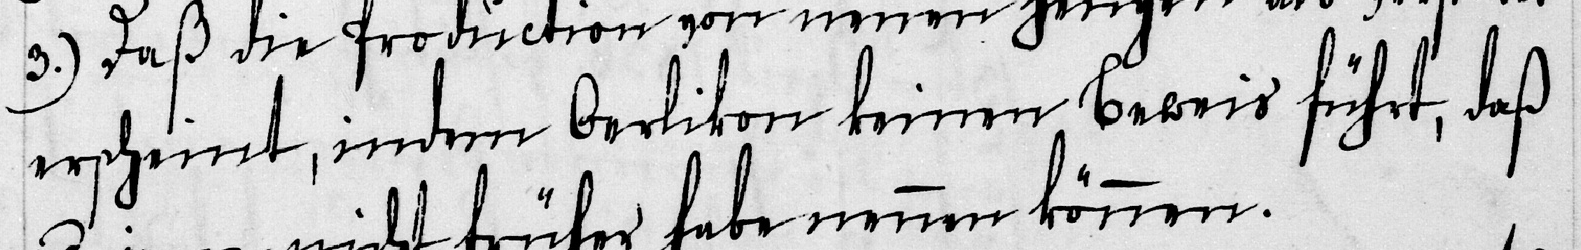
erscheint, indem Oerlikon keinen Beweis führt, daß
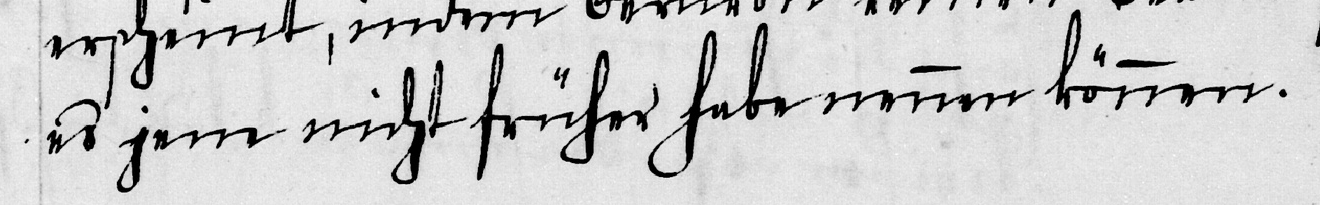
es jene nicht früher habe nennen können.
